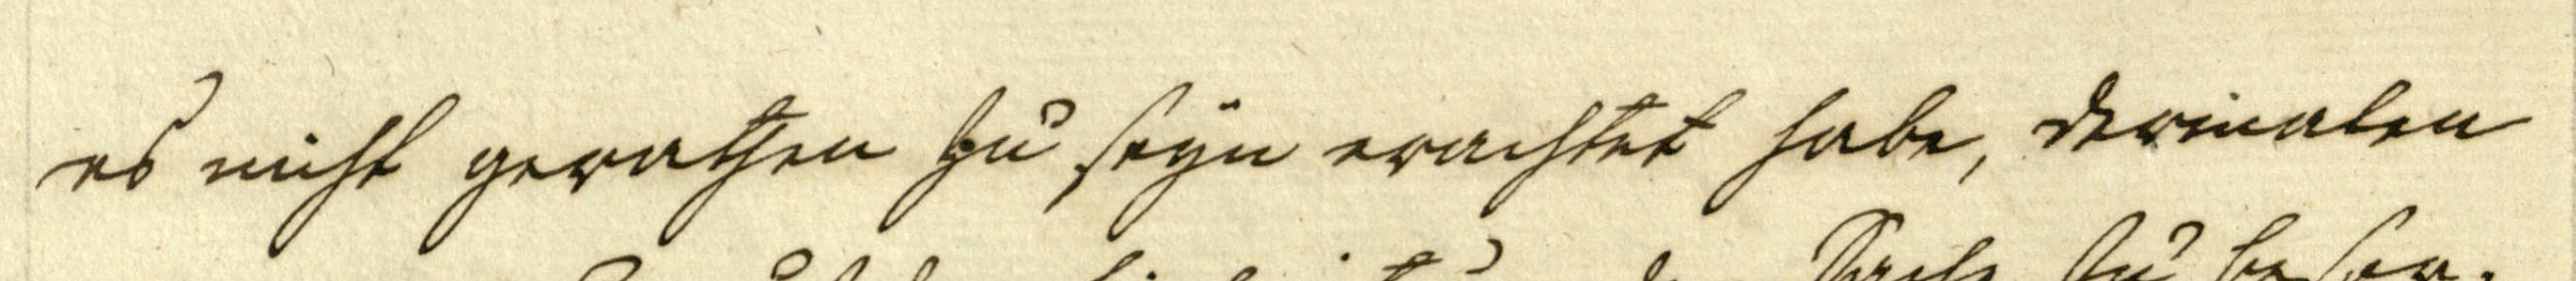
es nicht gerathen zu seÿn erachtet habe, dermalen
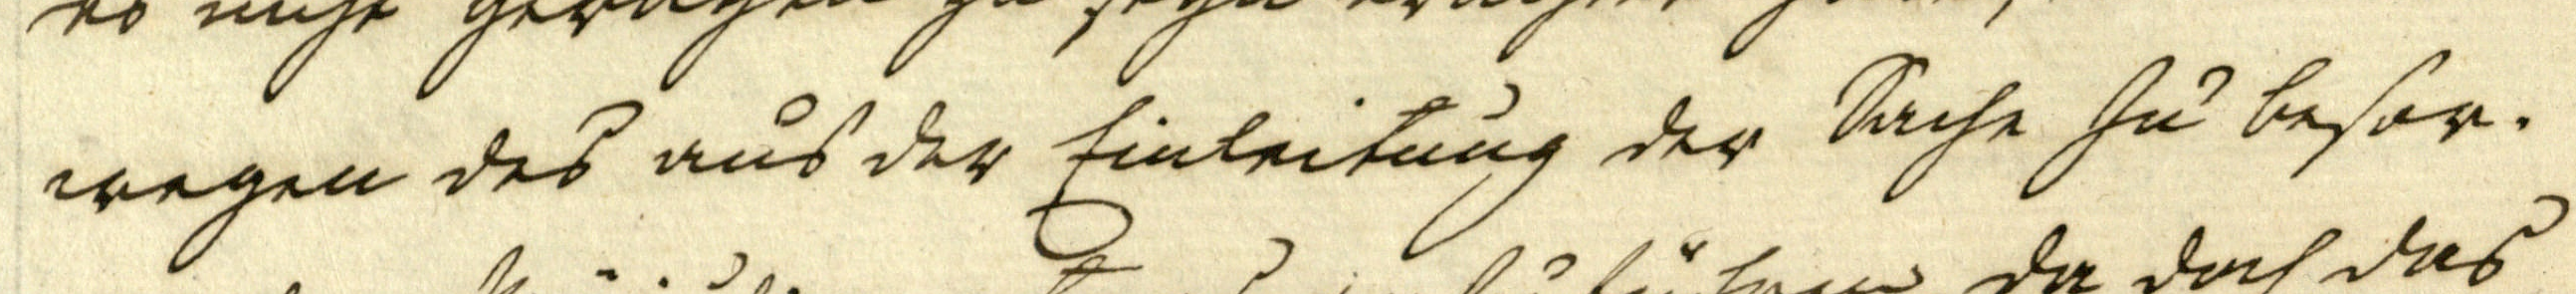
wegen des aus der Einleitung der Sache zu besor¬
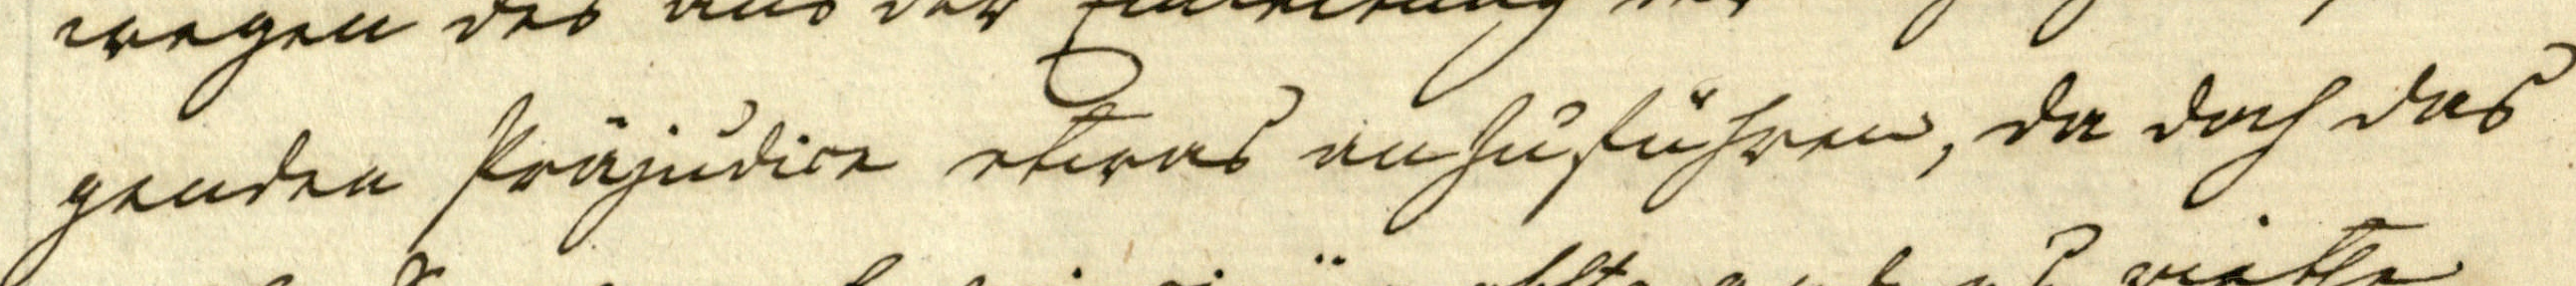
genden Präjudice etwas anzuführen, da doch das
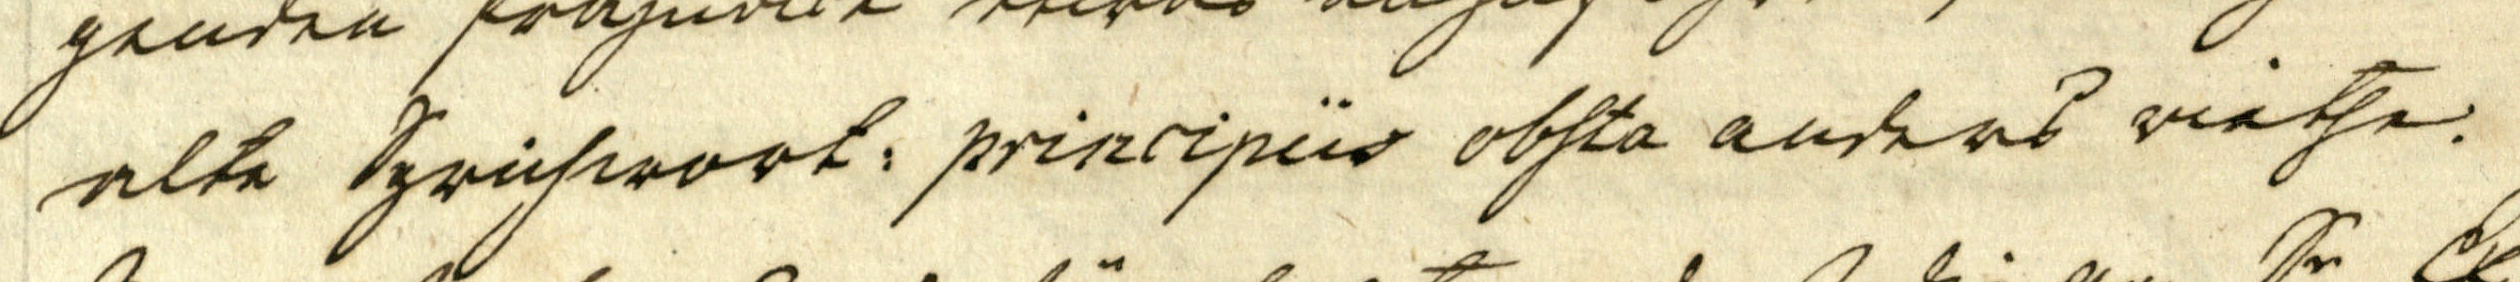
alte Sprichwort: principiis obhta anders riethe:
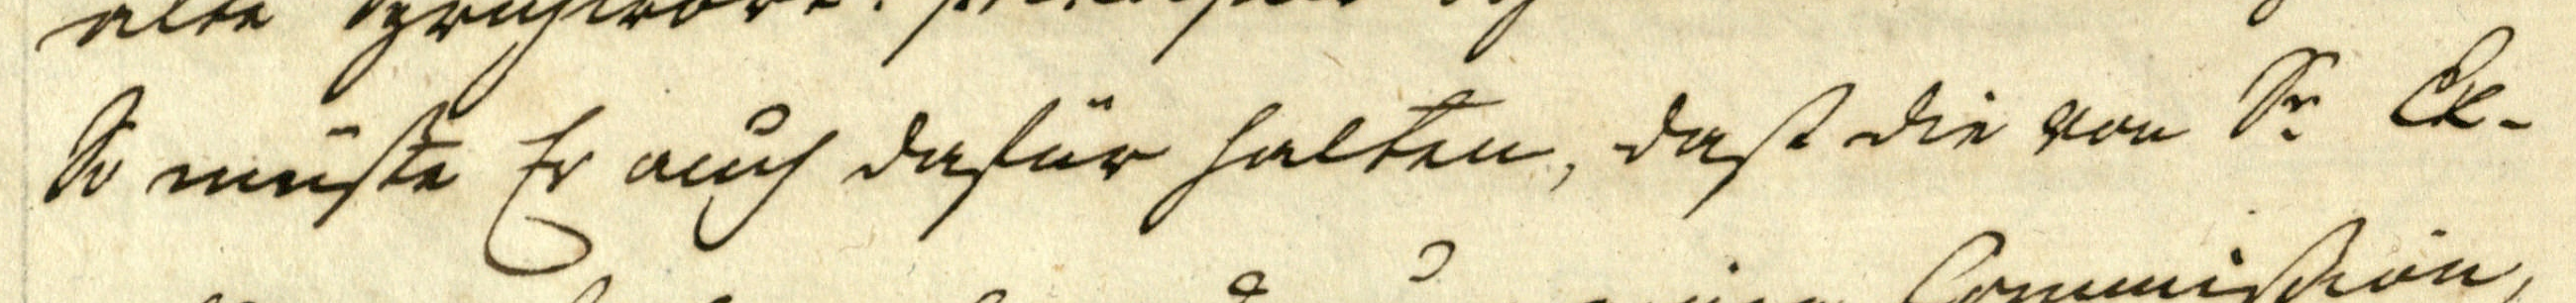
So müßte Er auch dafür halten, daß die von Sr Ex¬
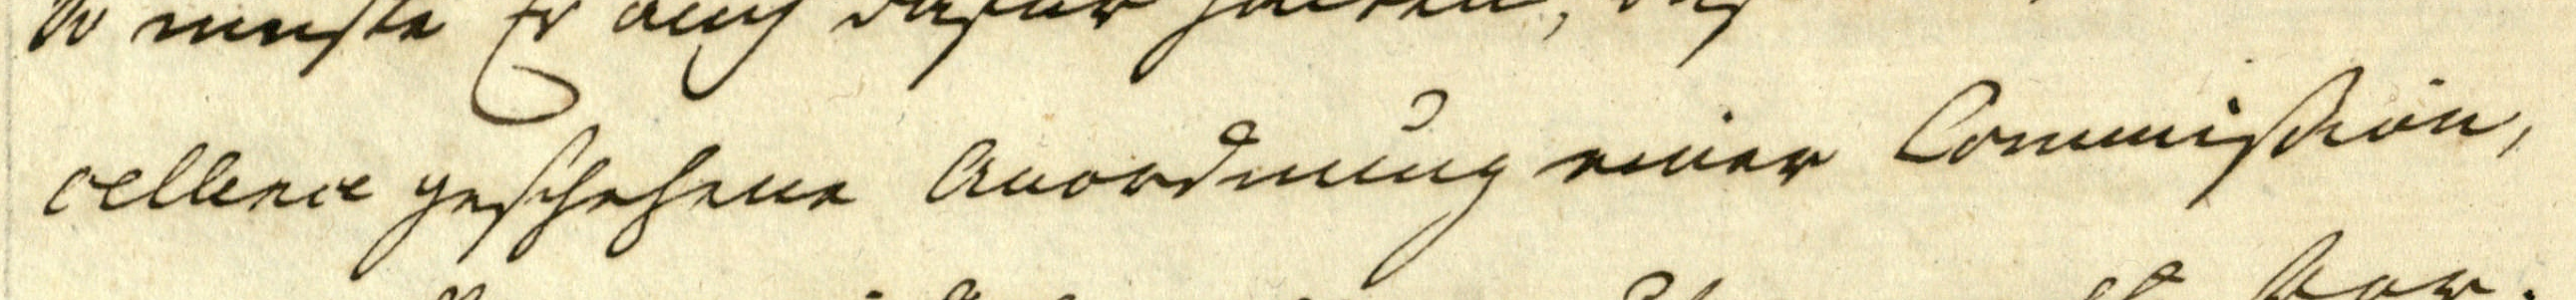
cellence geschehene Anordnung einer Commission,
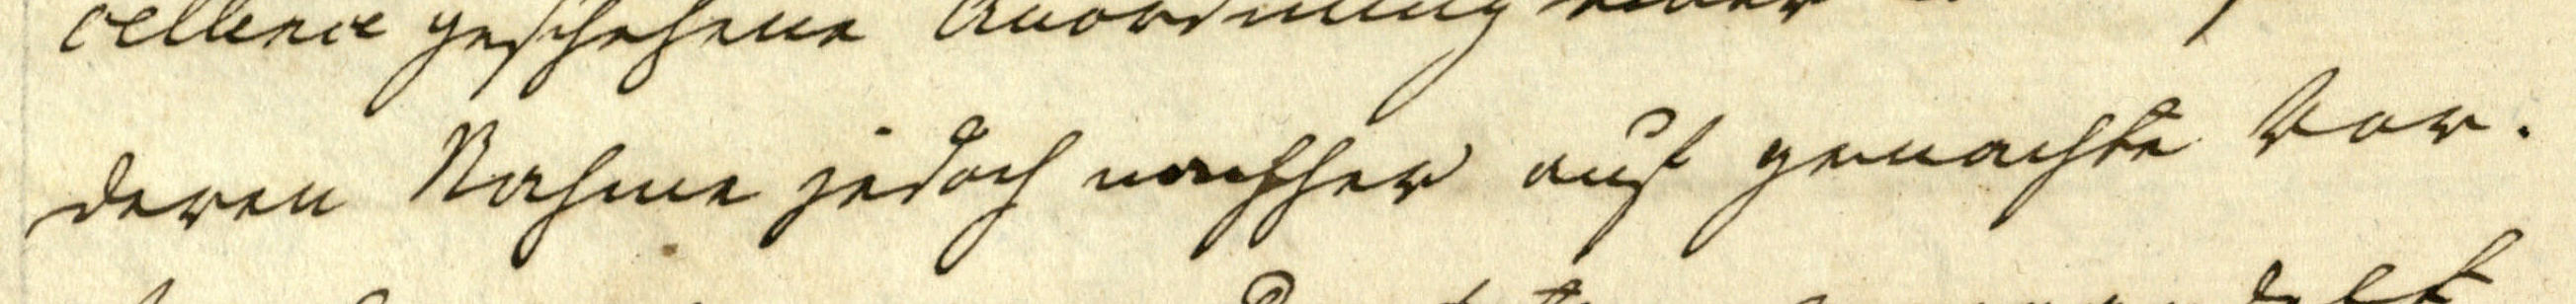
deren Nahme jedoch nachher auf gemachte Vor¬
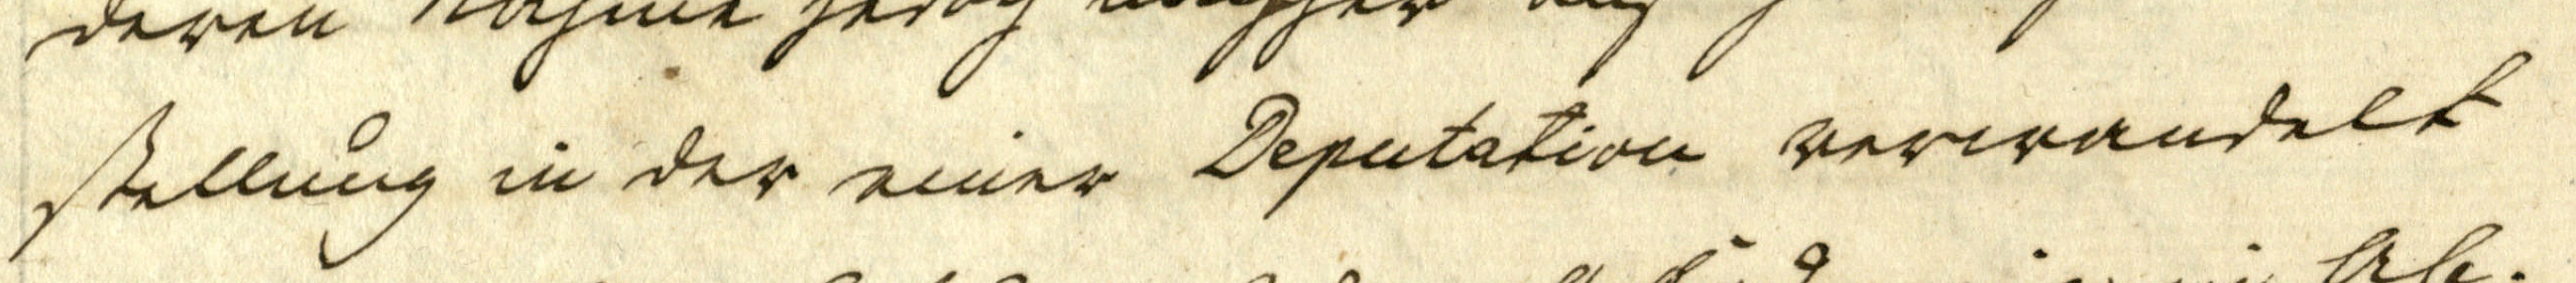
stellung in der einer Deputation verwandelt
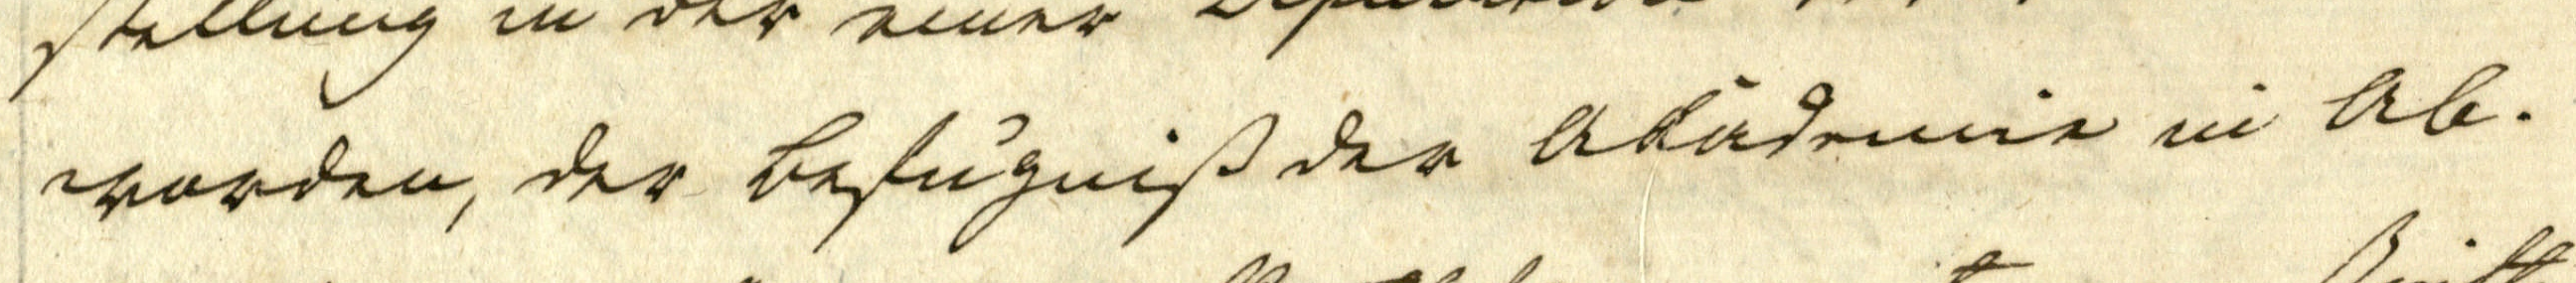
worden, der Befugniß der Akademie in Ab¬
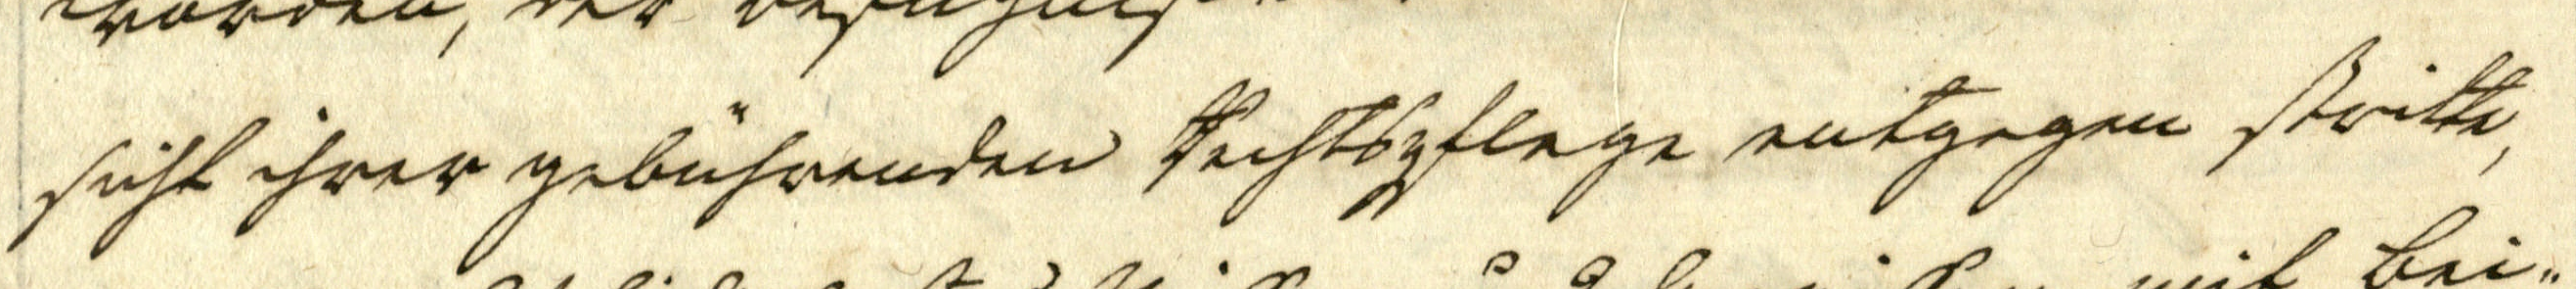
sicht ihrer gebührenden Rechtspflege entgegen stritte,
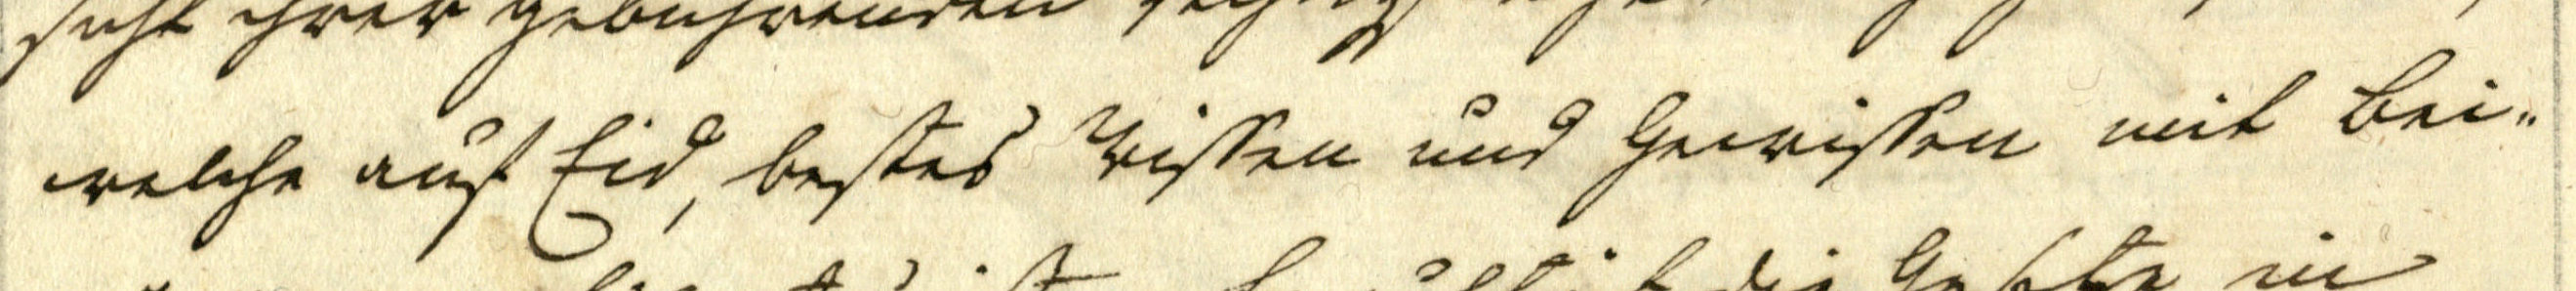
welche auf Eid, bestes Wissen und Gewissen mit Bei¬
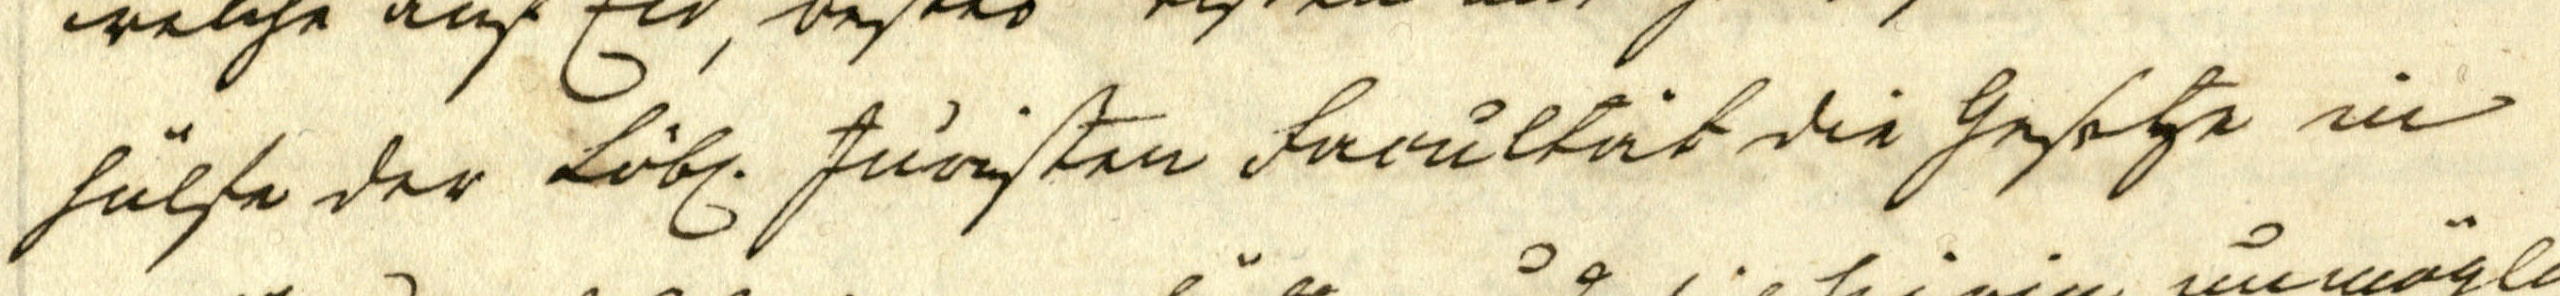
hülfe der Löbl. Juristen Facultät die Gesetze in
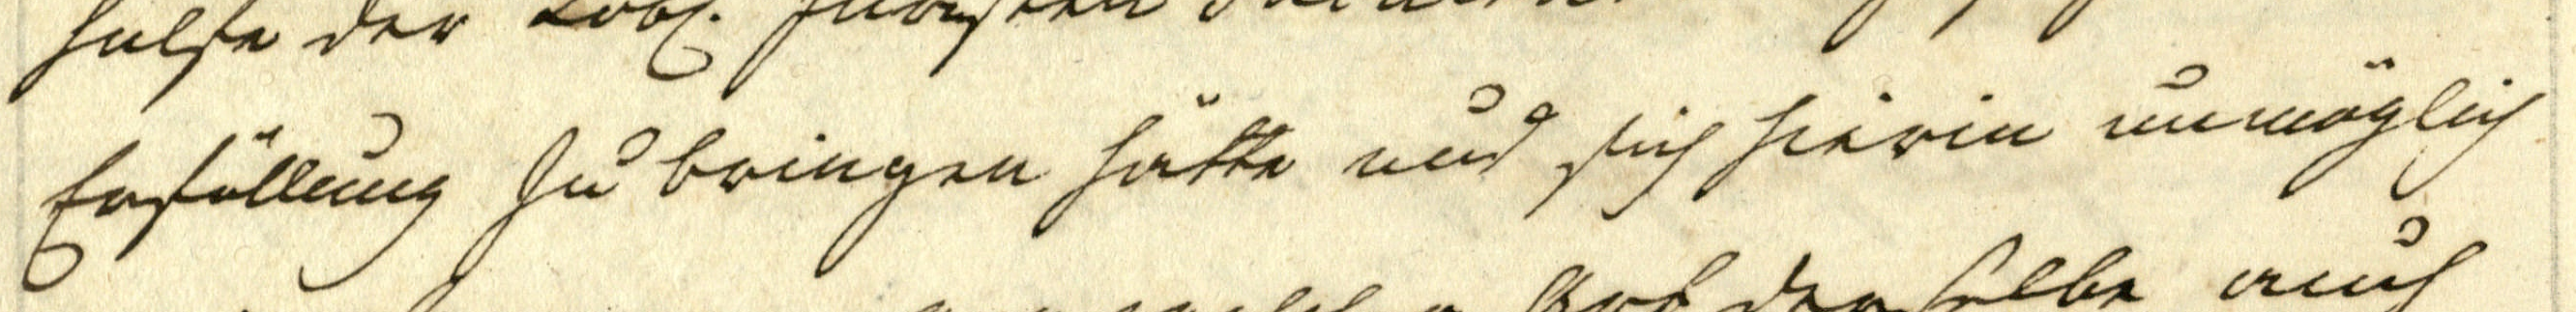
Erfüllung zu bringen hätte und sich hierin unmöglich
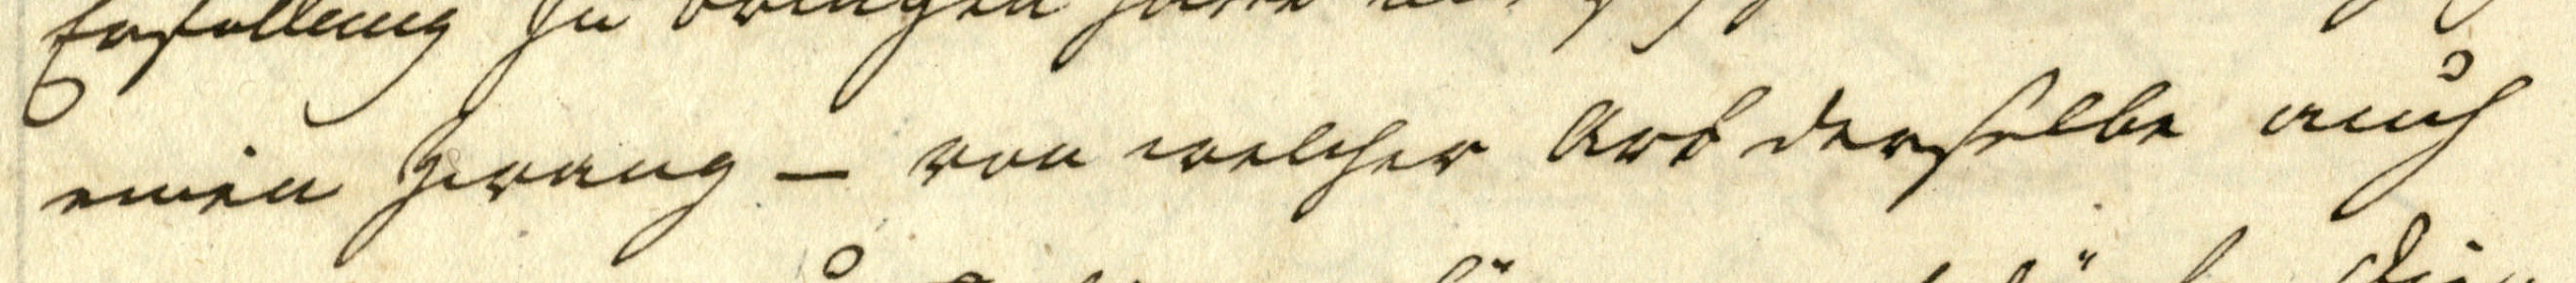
einen Zwang - von welcher Art derselbe auch
